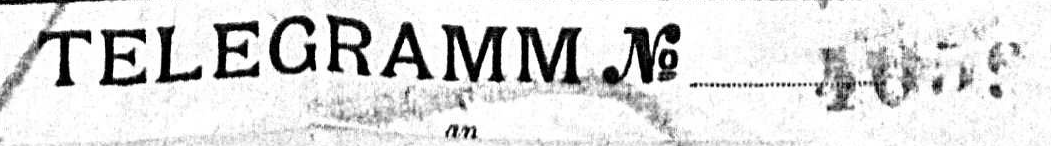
Telegramm No xx
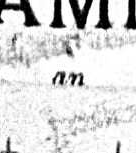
an
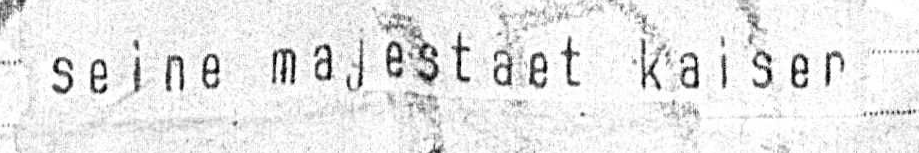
seine majestaet kaiser
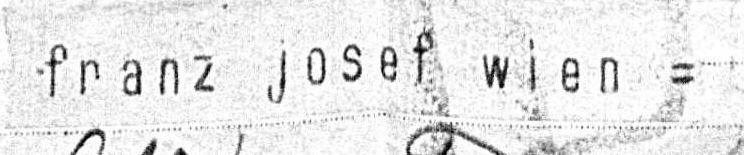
franz josef wien =
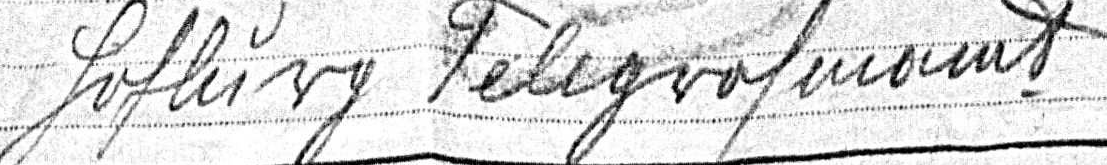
xx Telegrafenamt
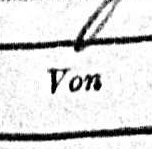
Von
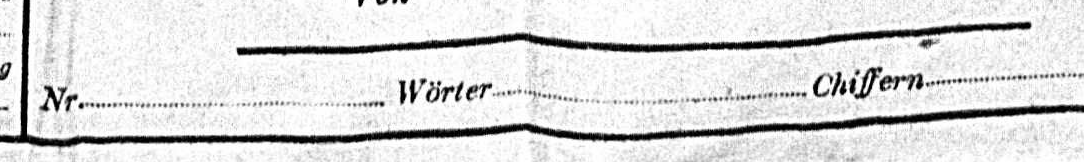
Nr.................................Wörter...............................Chiffern.................
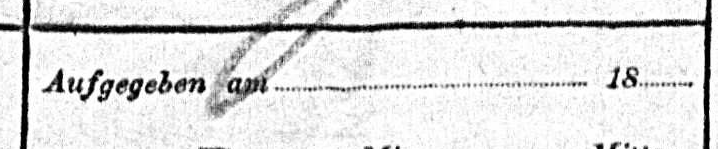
Aufgegeben am................................18....
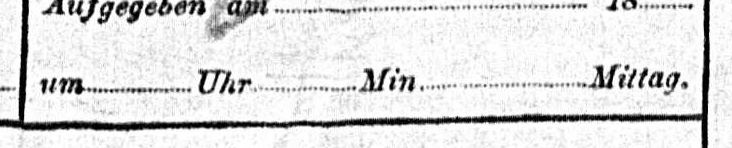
um ...............Uhr..........Min..............Mittag.
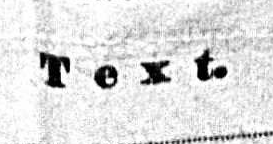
Text.
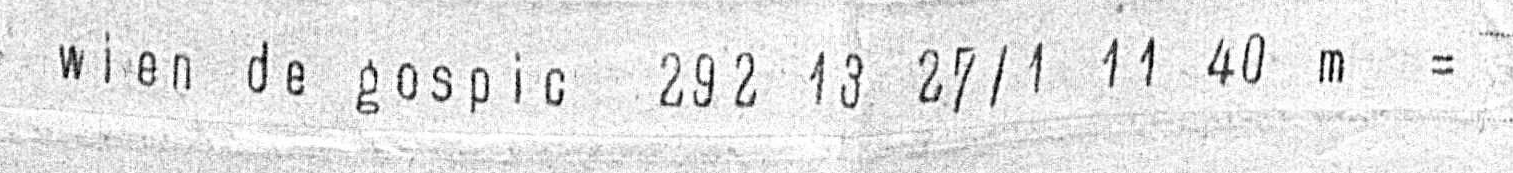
wien de gospic 292 13 27/1 11 40 m =
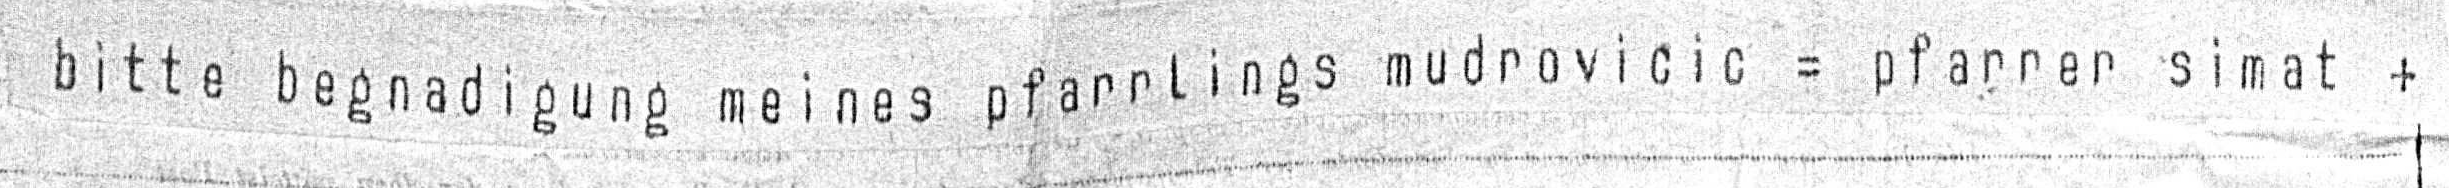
bitte begnadigung meines pfarrlings mudrovicic = pfarrer simat +
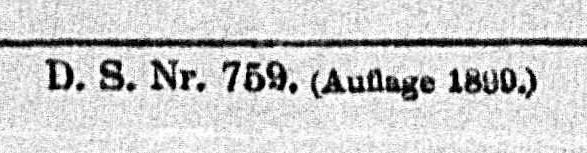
D. S. Nr. 759. (Auflage 1890.)
